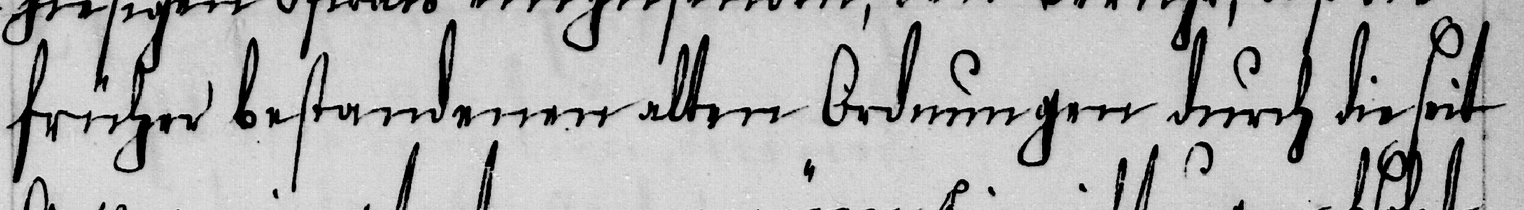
früher bestandenen alten Ordnungen durch die seit
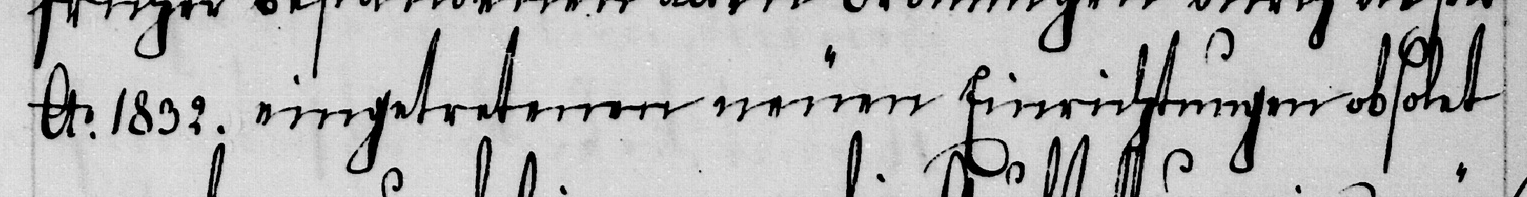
Ao. 1832. eingetretenen neuen Einrichtungen obsolet
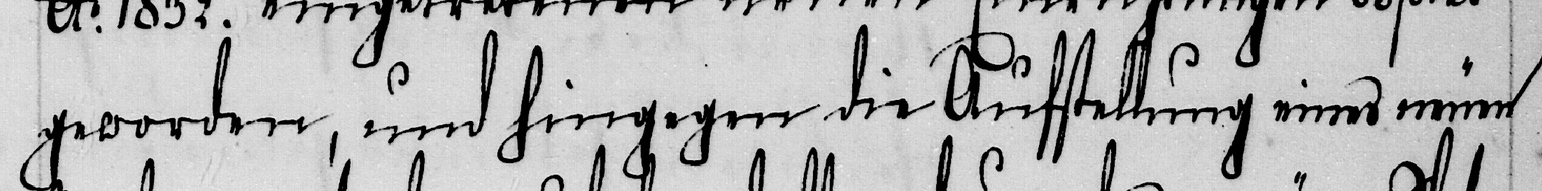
geworden, und hingegen die Aufstellung eines neuen
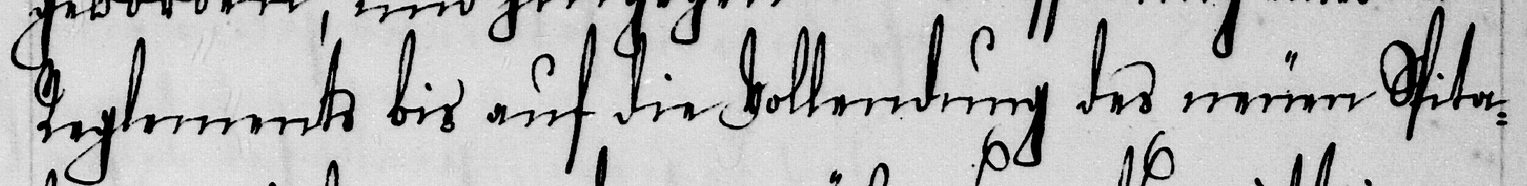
Reglements bis auf die Vollendung des neuen Spita¬
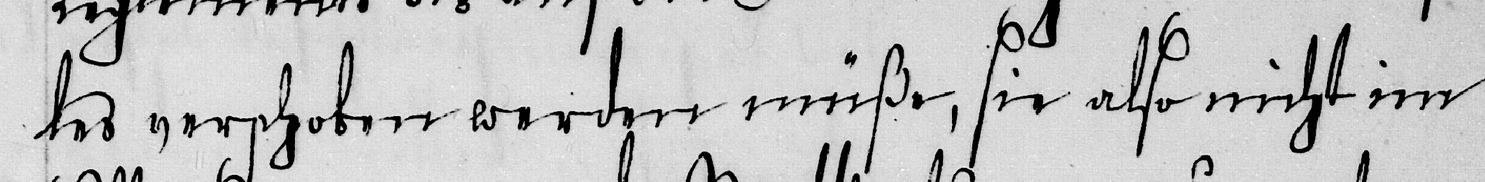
les verschoben werden müße, sie also nicht im
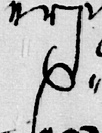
s¬
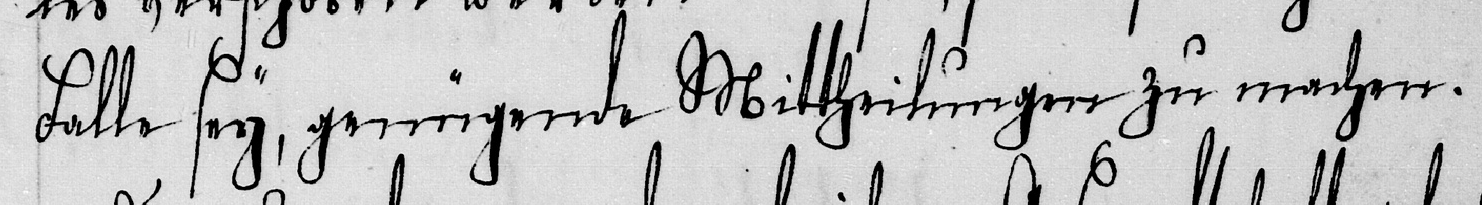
Falle sey, genügende Mittheilungen zu machen.
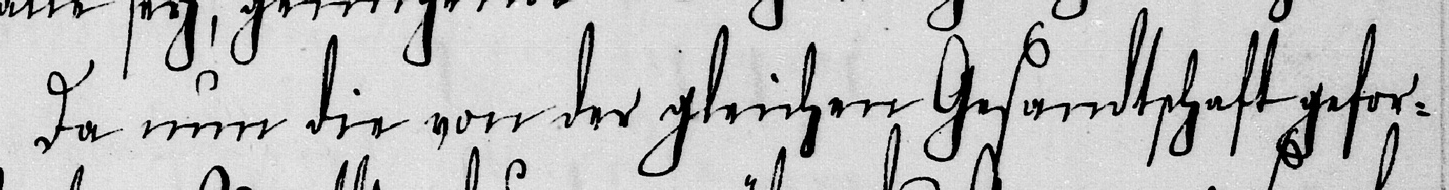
Da nun die von der gleichen Gesandtschaft gefor¬
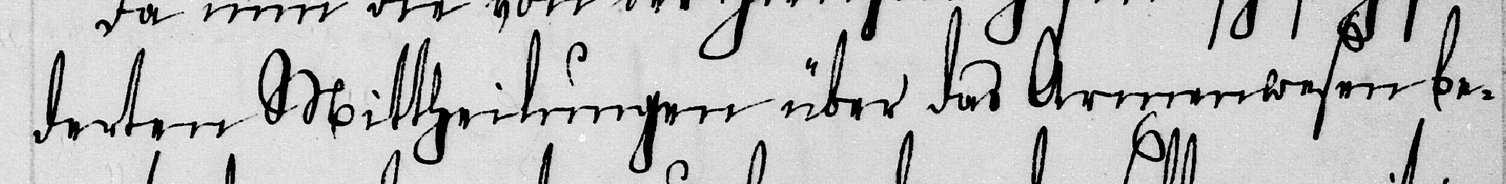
derten Mittheilungen über das Armenwesen be¬
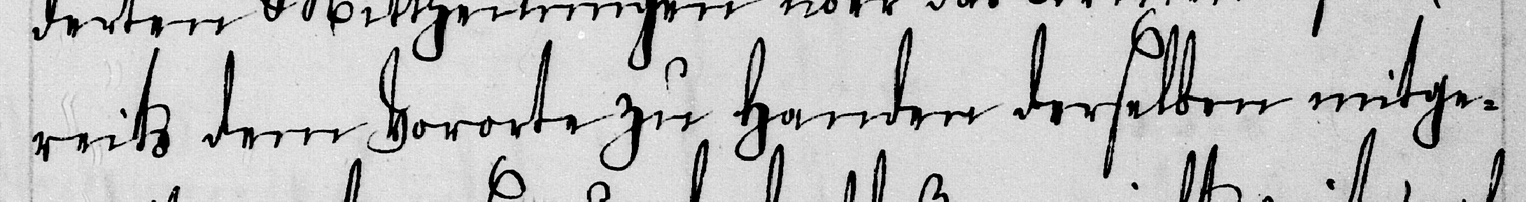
reits dem Vororte zu Handen derselben mitge¬
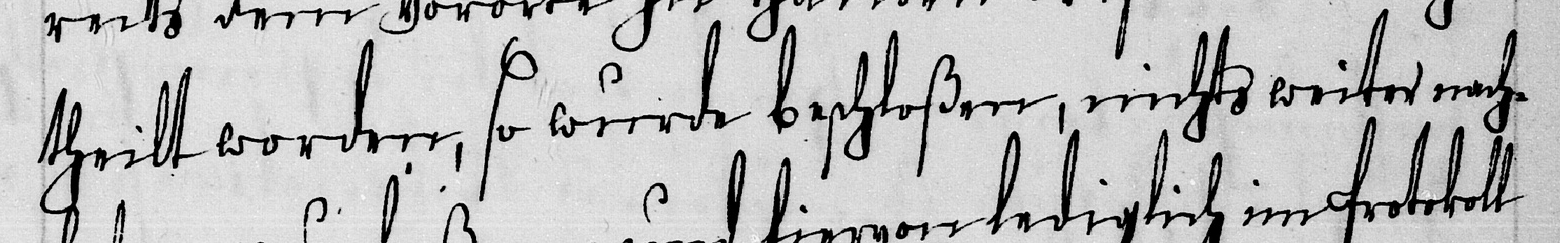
theilt worden, so wurde beschloßen, nichts weiter nach¬
